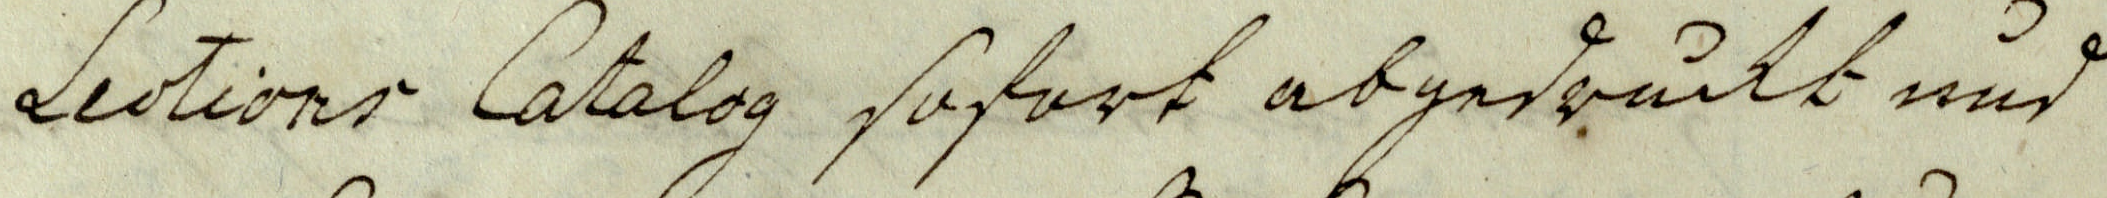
Lections Catalog sofort abgedruckt und
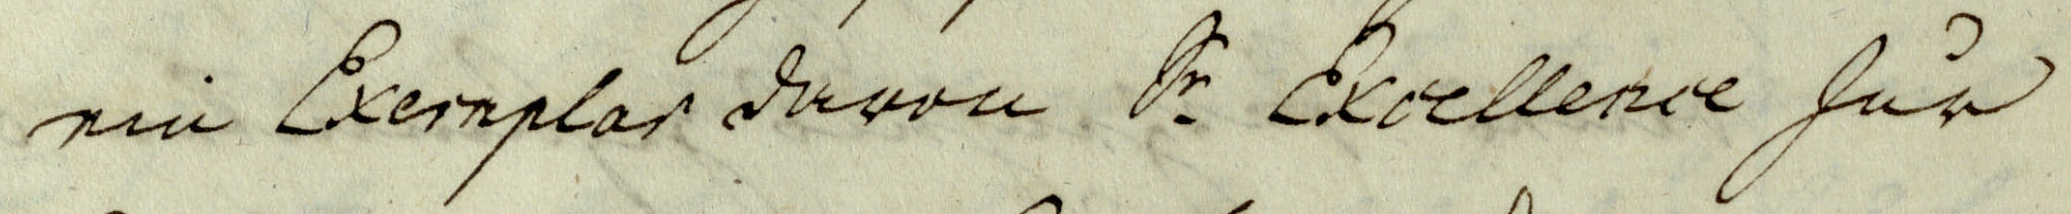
ein Exemplar davon Sr. Excellence zur
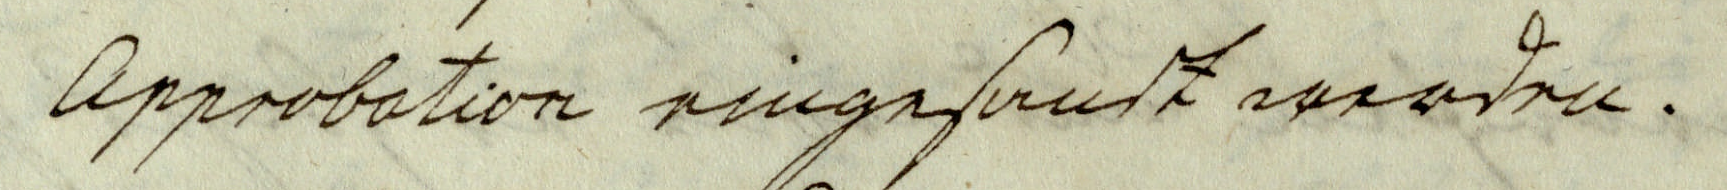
Approbation eingesandt werden.
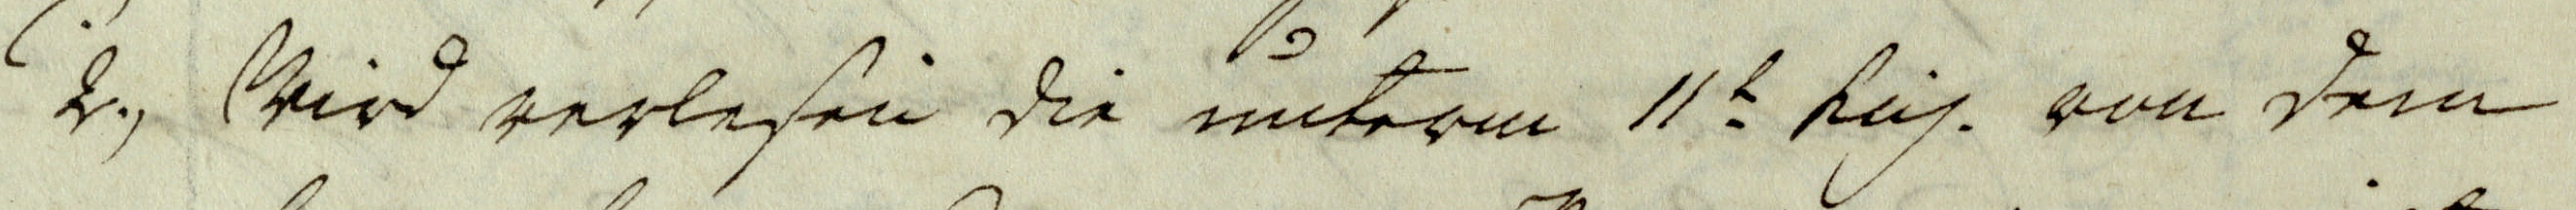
2., Wird verlesen die unterm 11t. huj. von dem
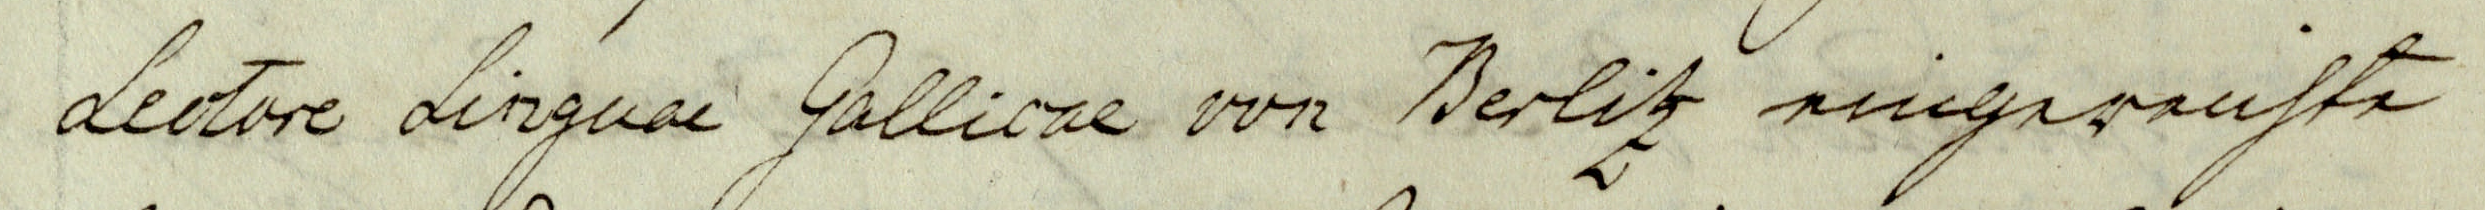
Lectore Linguae Gallicae von Berlitz eingereichte
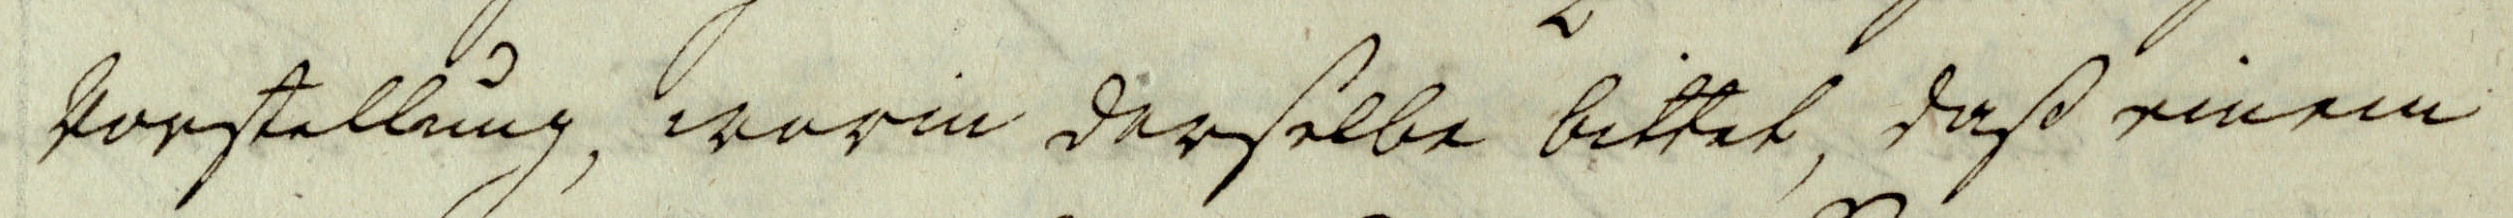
Vorstellung, worin derselbe bittet, daß einem
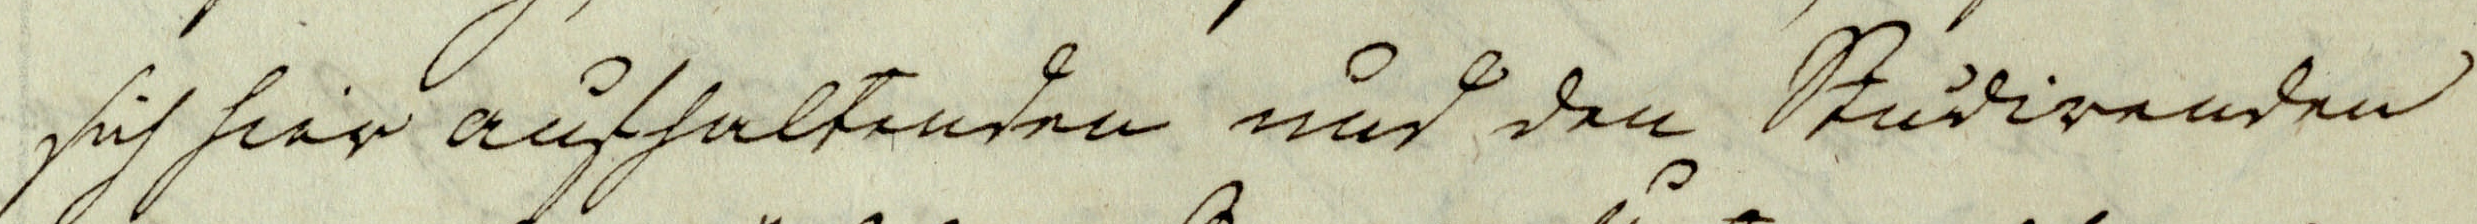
sich hier aufhaltenden und den Studirenden
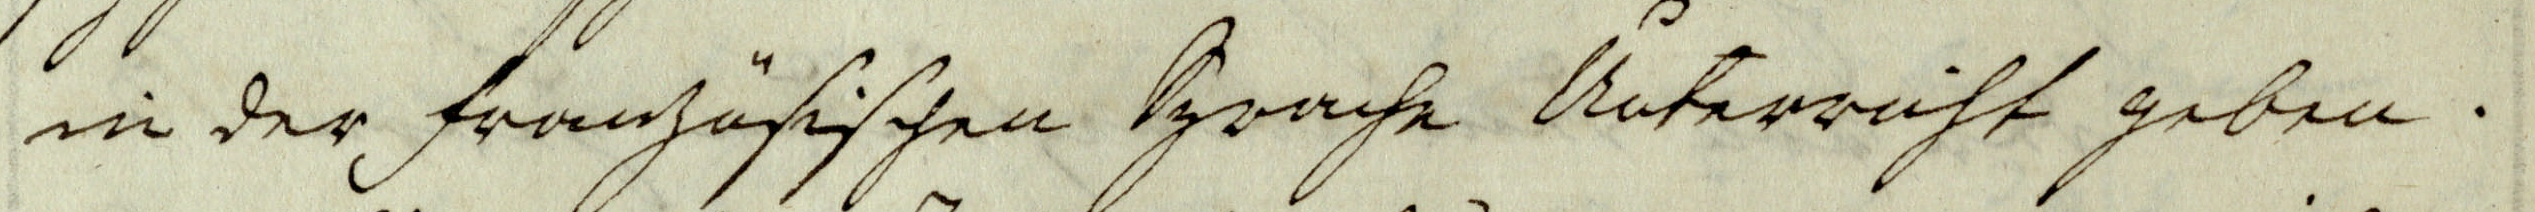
in der Französischen Sprache Unterricht geben¬
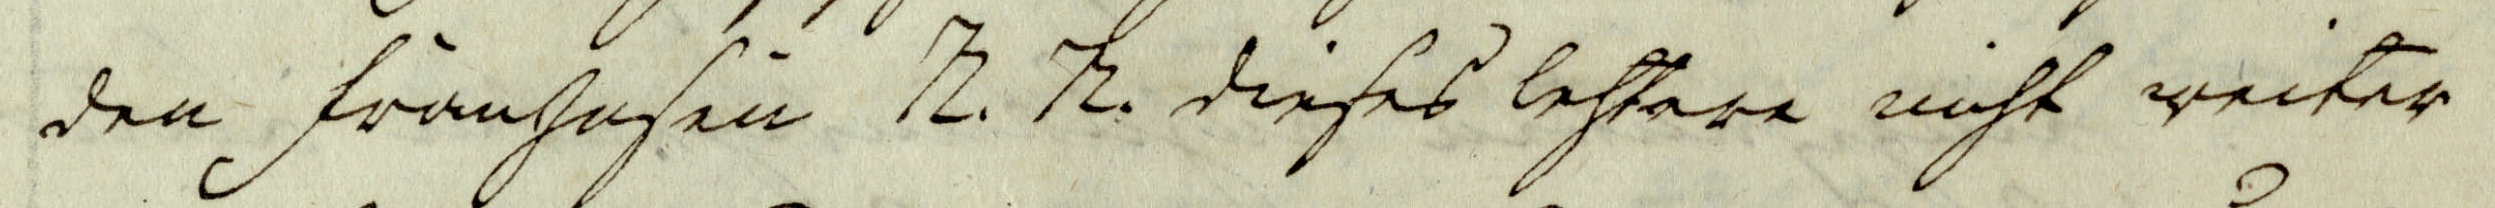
den Franzosen N. N. dieses letztere nicht weiter
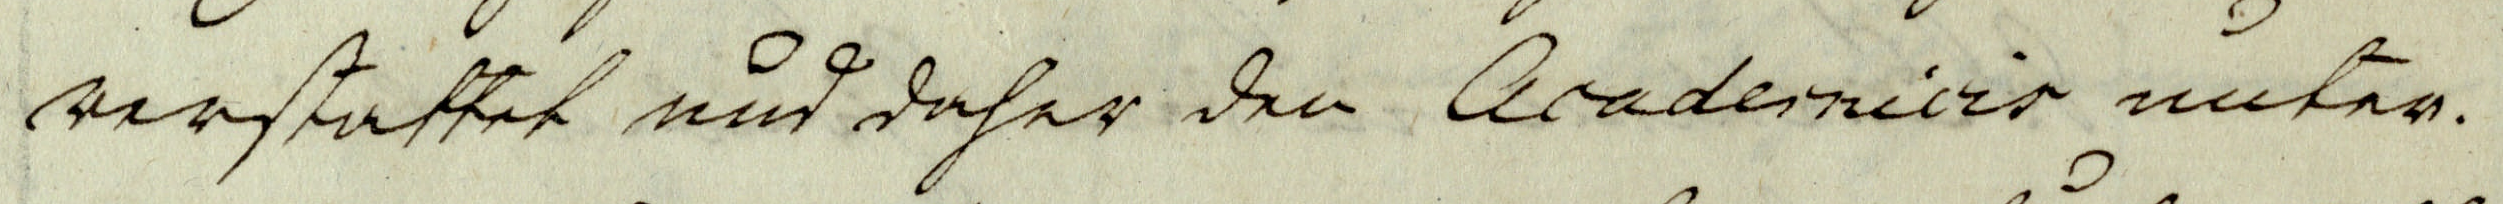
verstattet und daher den Academicis unter¬
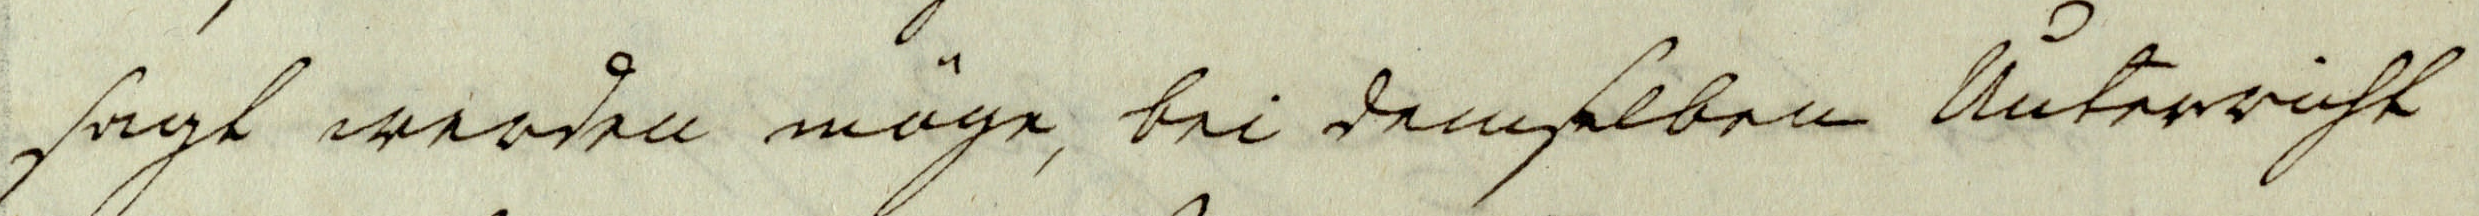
sagt werden möge, bei demselben Unterricht
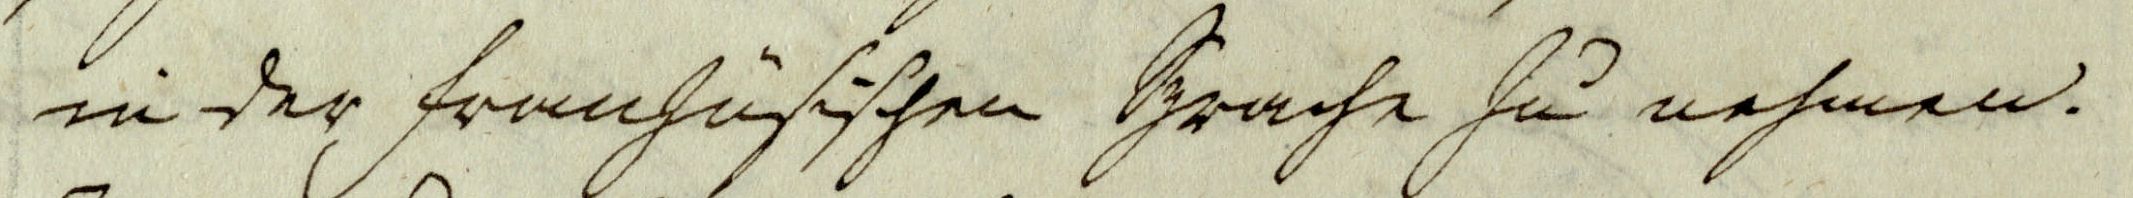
in der Französischen Sprache zu nehmen.
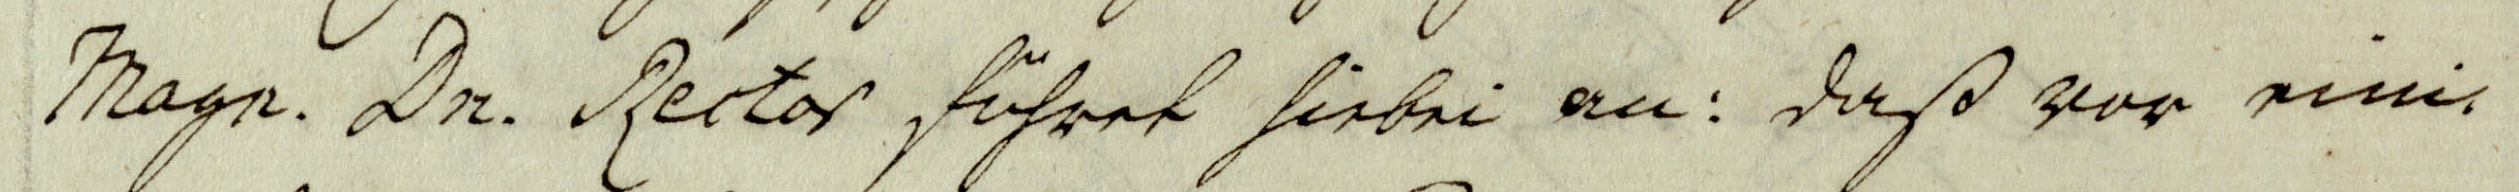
Magn. Dn. Rector führet hiebei an: daß vor eini¬
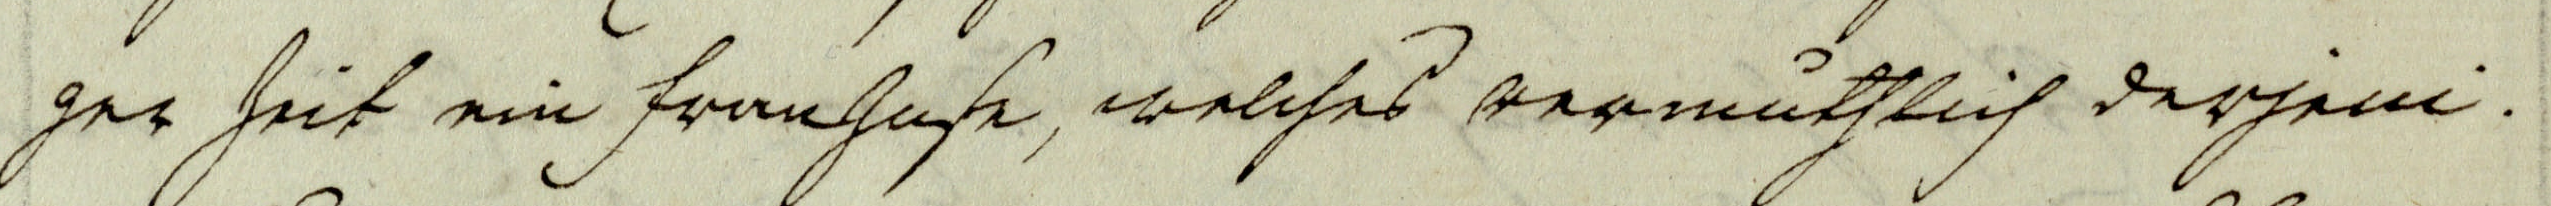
ger Zeit ein Franzose, welches vermuthlich derjeni¬
